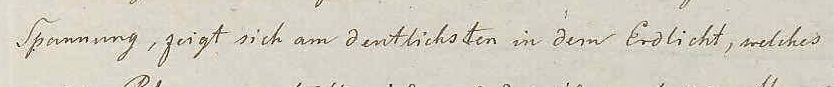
Spannung, zeigt sich am deutlichsten in dem Erdlicht, welches
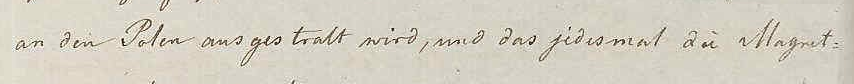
an den Polen ausgestralt wird, und das jedesmal die Magnet-
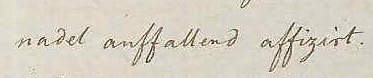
nadel auffallend affizirt.
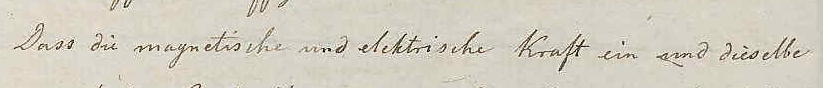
Dass die magnetische und elektrische Kraft ein und dieselbe
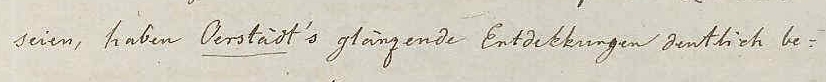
seien, haben Oerstädt's glänzende Entdekkungen deutlich be-
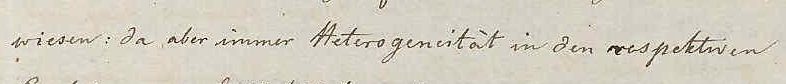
wiesen: da aber immer Heterogenität in den respektiven
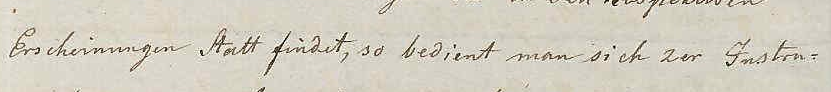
Erscheinungen statt findet, so bedient man sich 2er Instru-
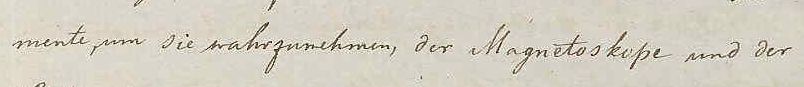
mente, um sie wahrzunehmen, der Magnetoskope und der
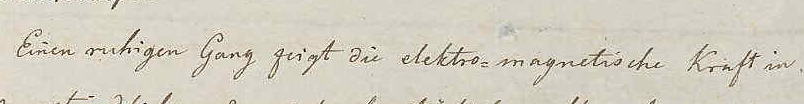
Einen ruhigen Gang zeigt die elektro-magnetische Kraft in
